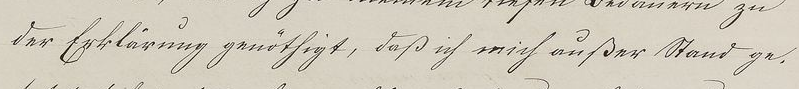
der Erklärung genöthigt, daß ich mich außer Stand ge-
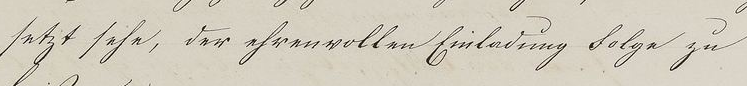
setzt sehe, der ehrenvollen Einladung Folge zu
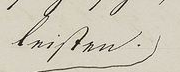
leisten.
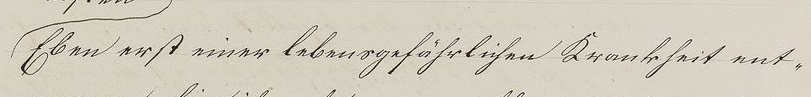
Eben erst einer lebensgefährlichen Krankheit ent-
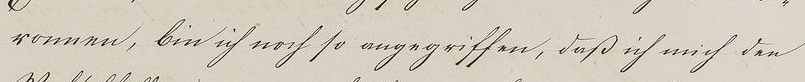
ronnen, bin ich noch so angegriffen, daß ich mich den
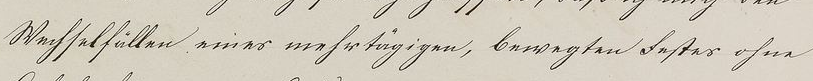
Wechselfällen eines mehrtägigen, bewegten Festes ohne
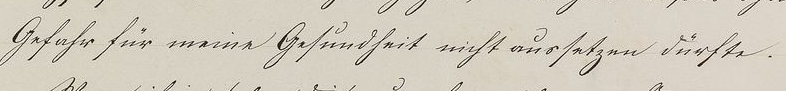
Gefahr für meine Gesundheit nicht aussetzen dürfte.
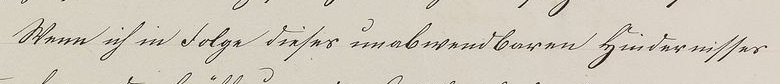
Wenn ich in Folge dieses unabwendbaren Hindernisses
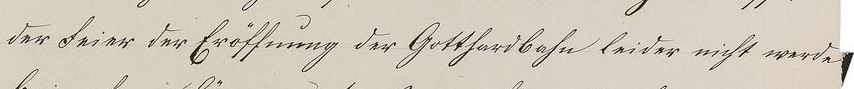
der Feier der Eröffnung der Gotthardbahn leider nicht werde
